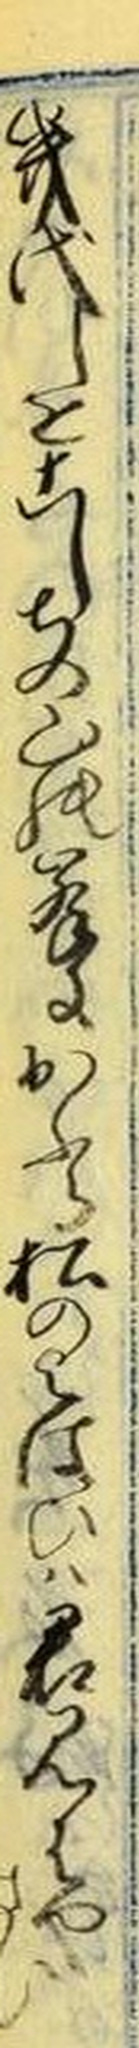幾代しをこしちの山の峯におふる松のよはひは君見はやさむ
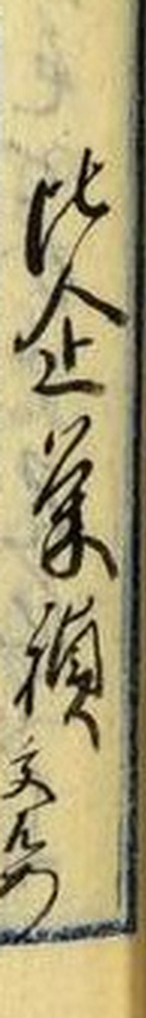比企栄禎文左衛門
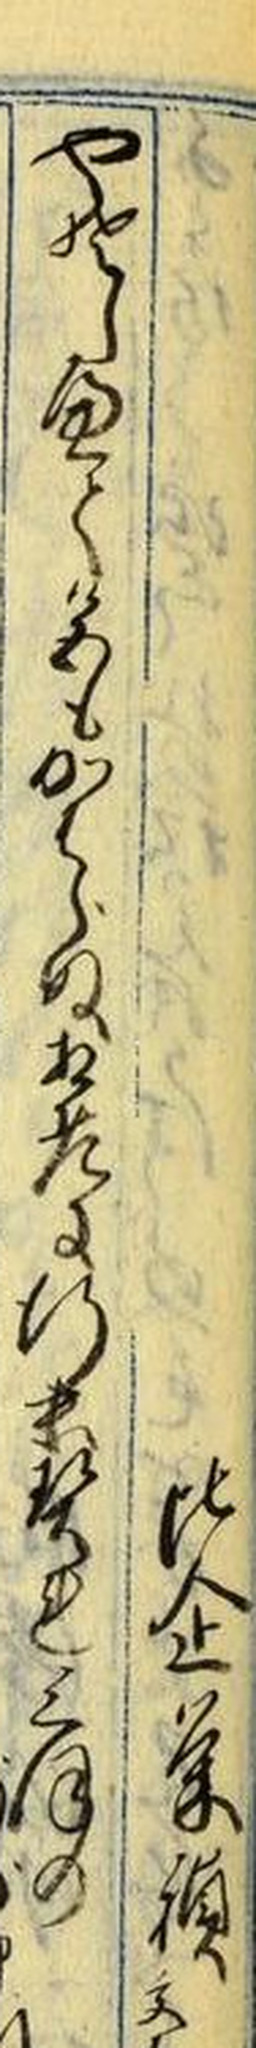やそしへて色もかはらぬ相老に行末契れみほのうらまつ
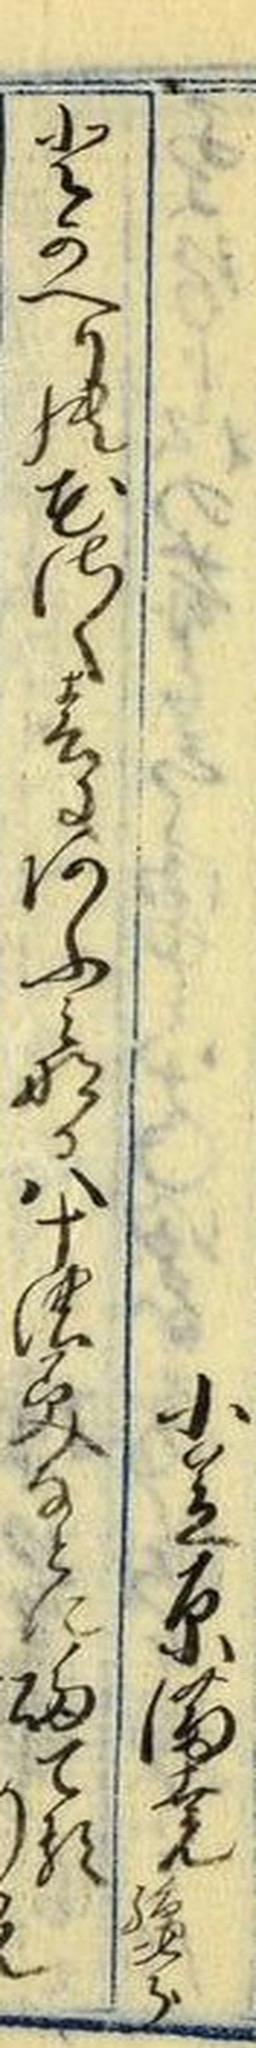とかへりの花さく春にあふみなる八十のみなとにたてる松かえ
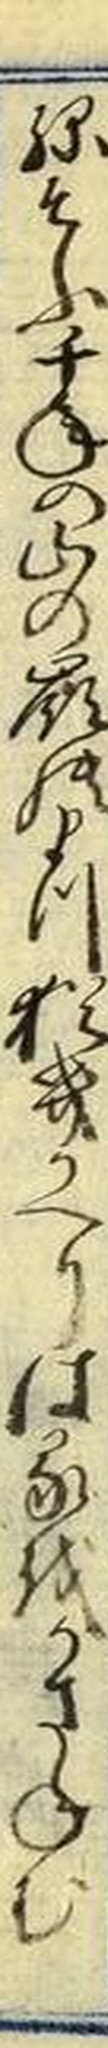緑そふ千年の山の嶺のまつ猶幾かへりはるをかさねむ
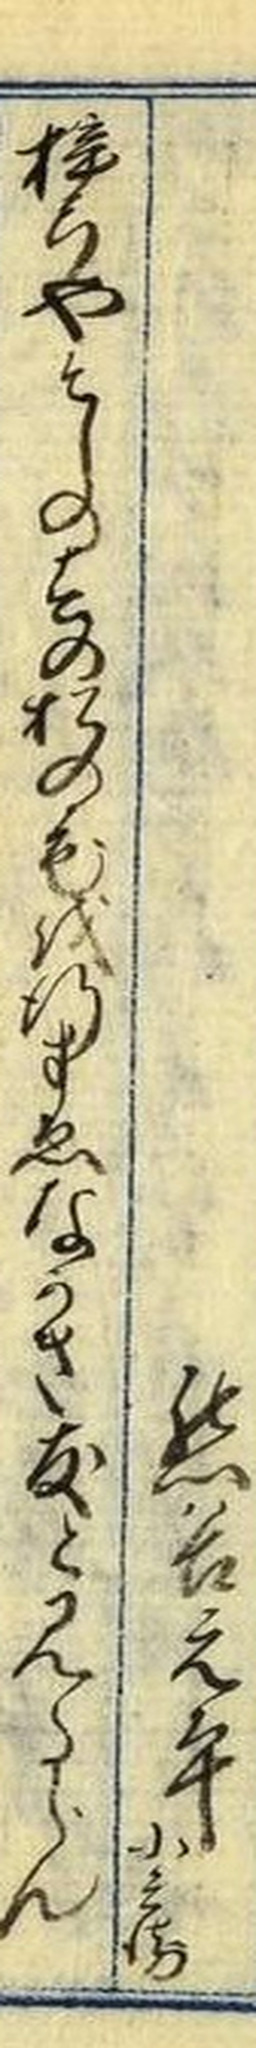梓弓やそしの春の松の色を行すゑなかき友と見るらん
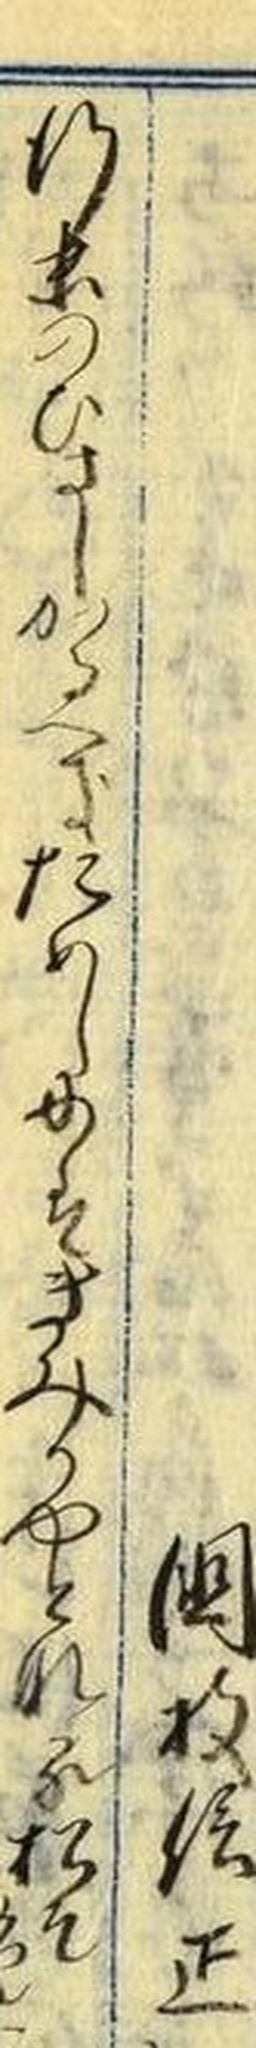行末のひさしかるへきためしにはきみかやとなる松そ色こき

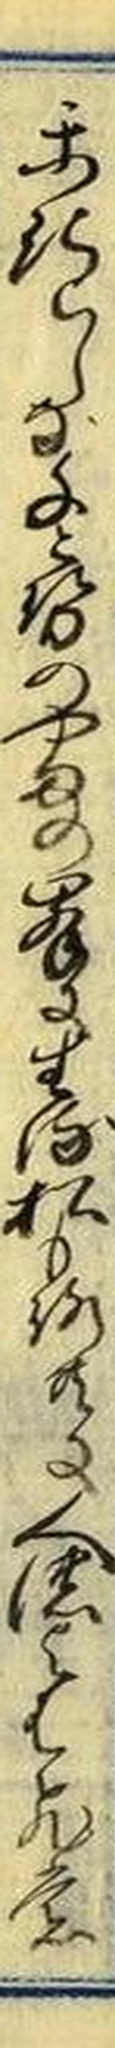かきらしなちとせのやまの峯に生る松もろ共に人のよわひも
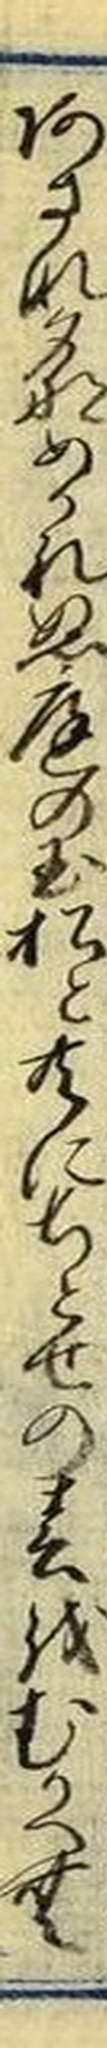あさな夕なめかれぬ庭の玉松と共にちとせの春をむかへむ
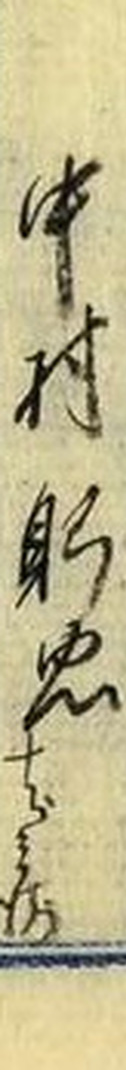中村躬忠十郎兵衛
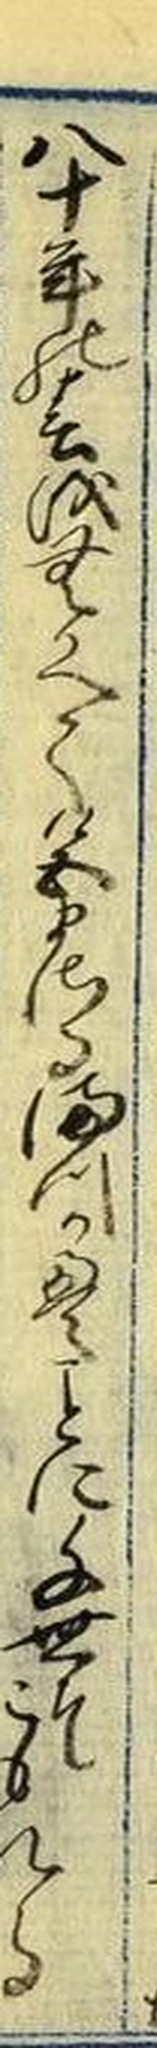八十年の春をむかへて色まさるまつかゑことに千世そこもれる
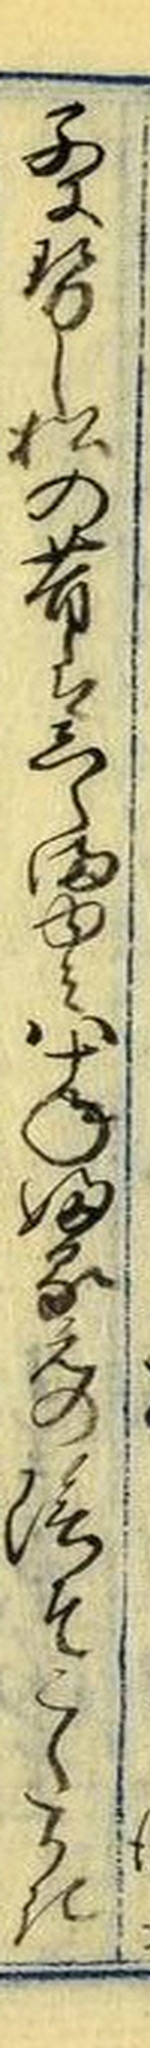ねにせし松の昔はしらまゆみ八十年ふるえの陰そこたかき
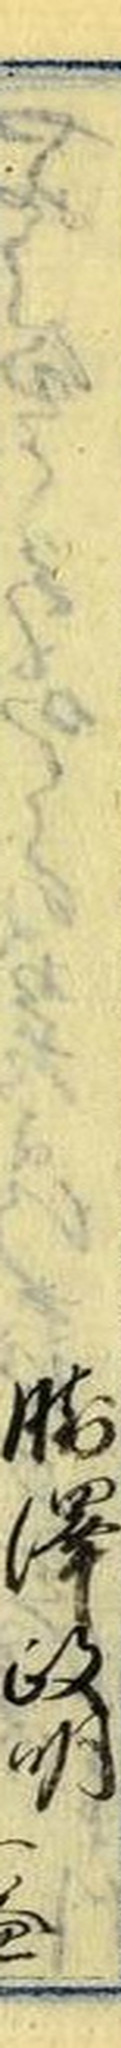勝澤政明一益
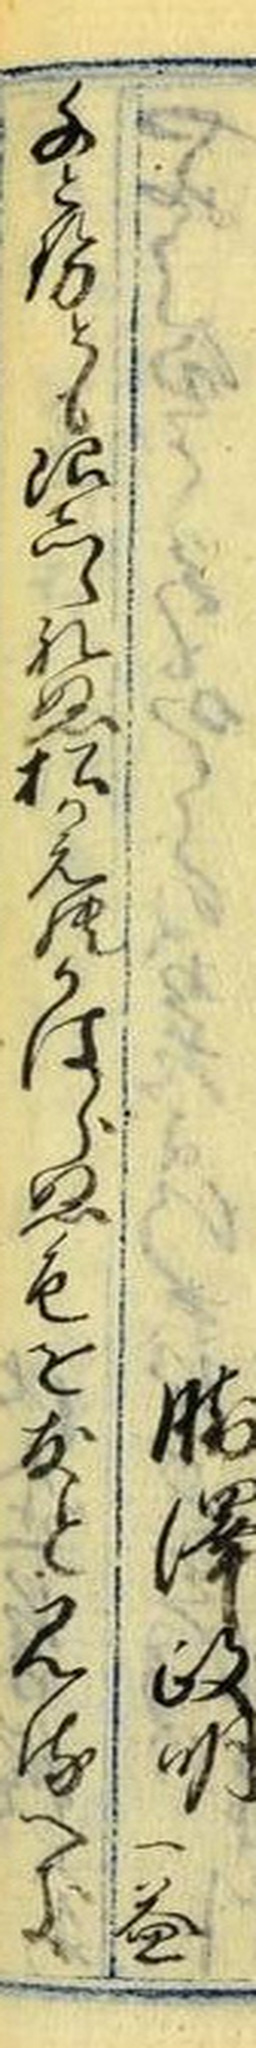ちとせとも限しられぬ松かえのかはらぬ色を友と見るへき
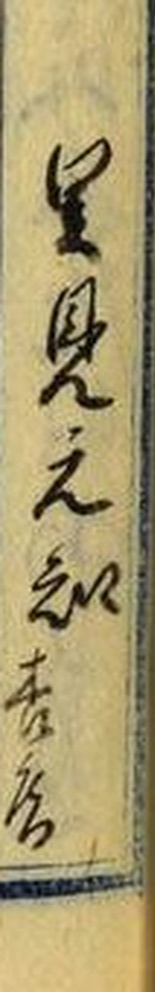里見元知青房
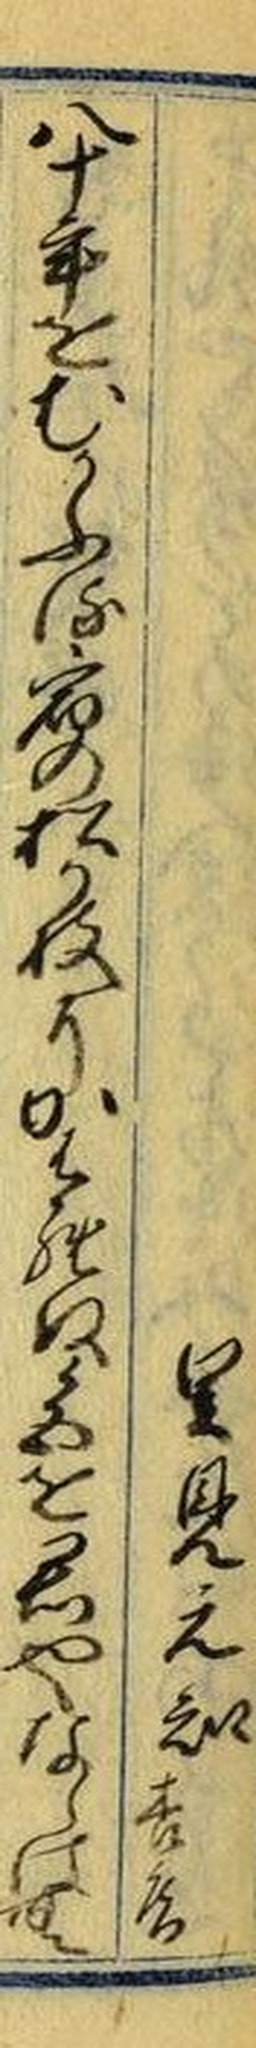八十年をむかふる宿の松か枝にかはらぬ色を君やならはむ
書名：温古集 三巻
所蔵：福井県文書館 Fukui Prefectural Archives
